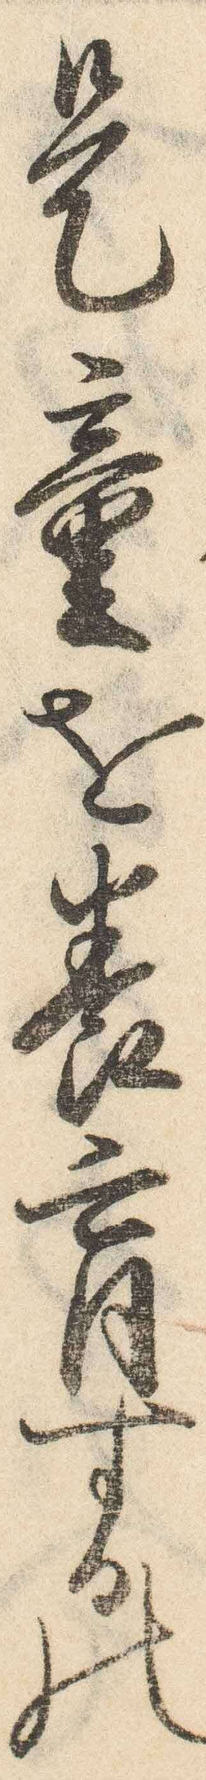是童を養育するの
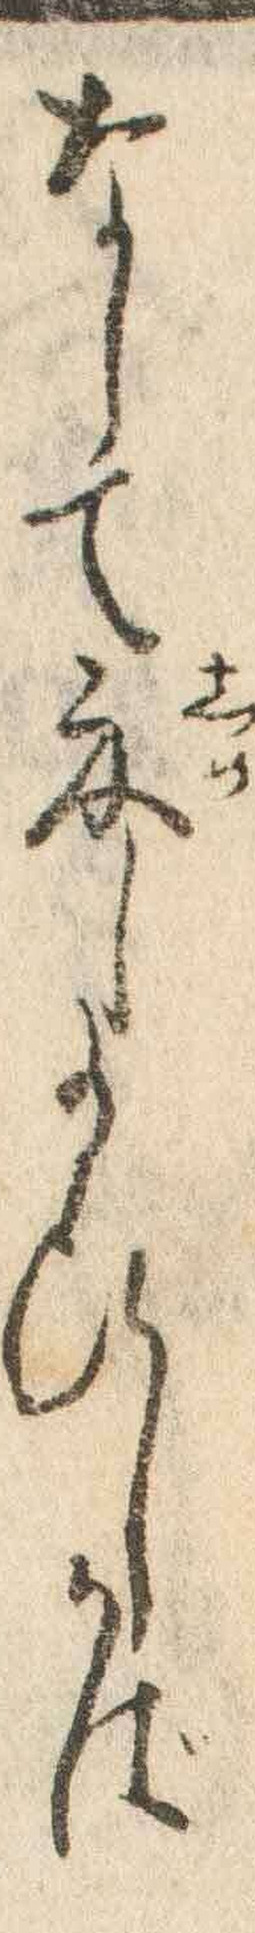なして示し給ひしかば
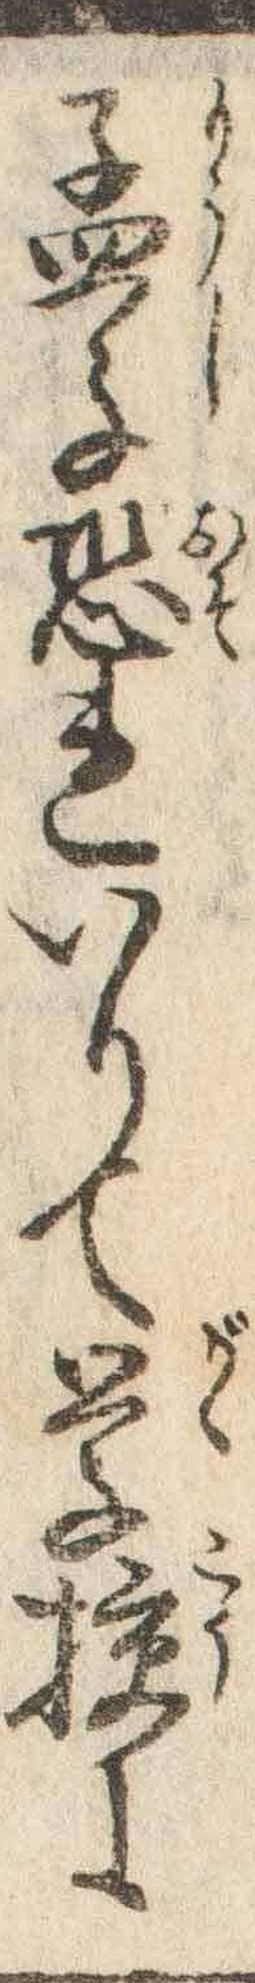孟子恐れいりて学校に
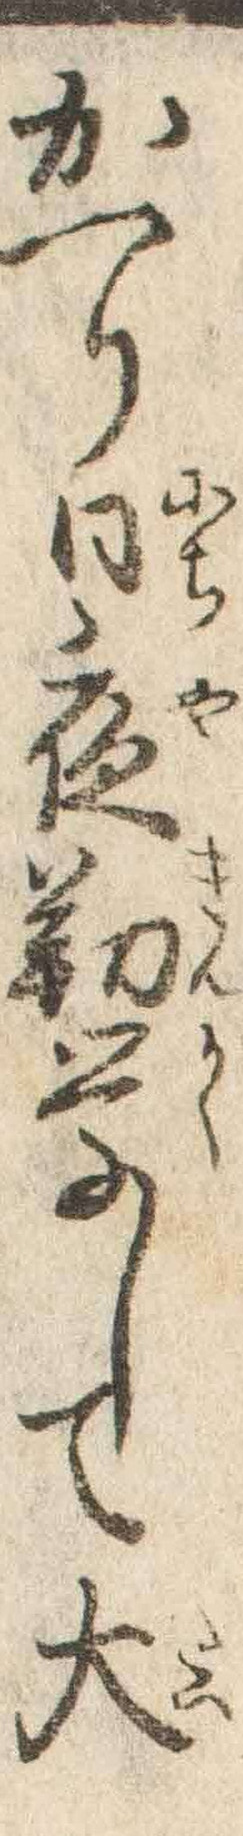かへり日夜勤学して大
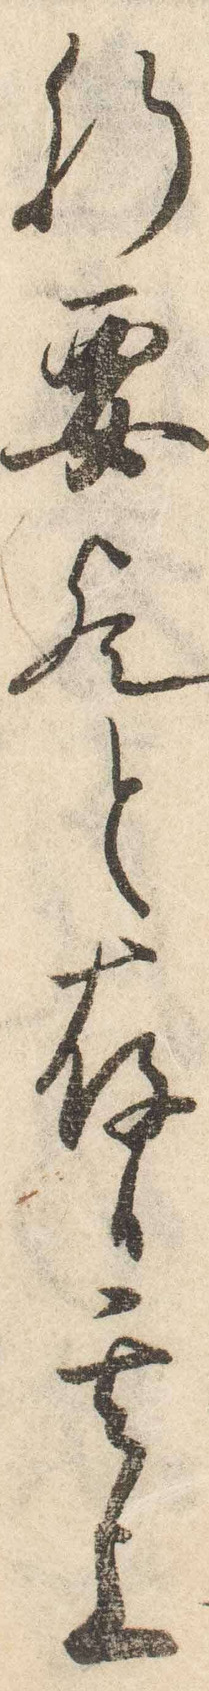肝要歟と存候其上
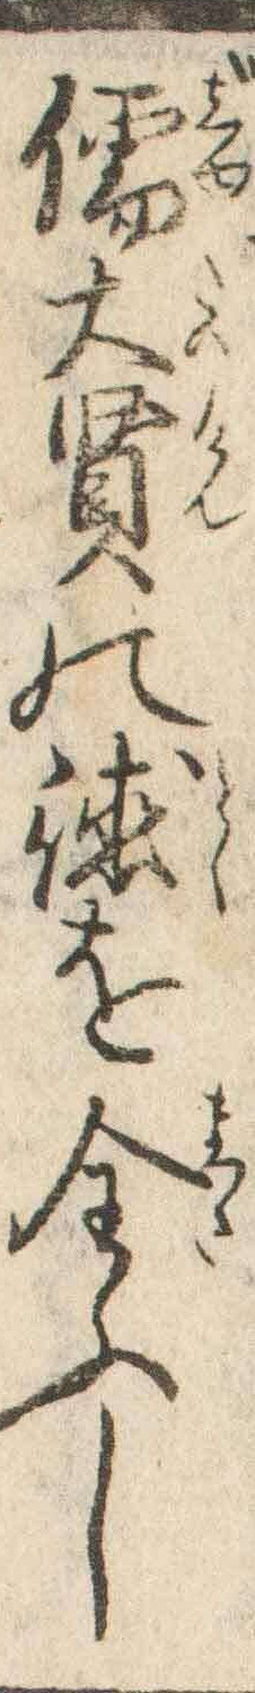儒大賢の徳を全ふし
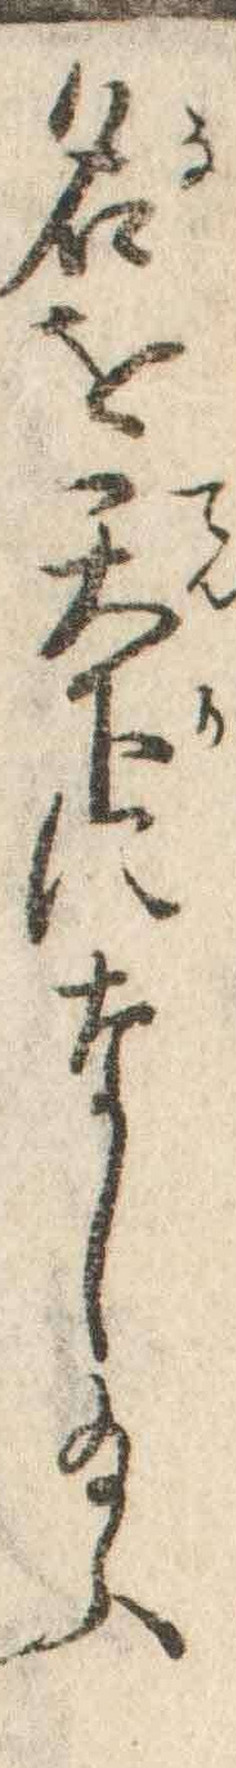名を天下になし給ふ
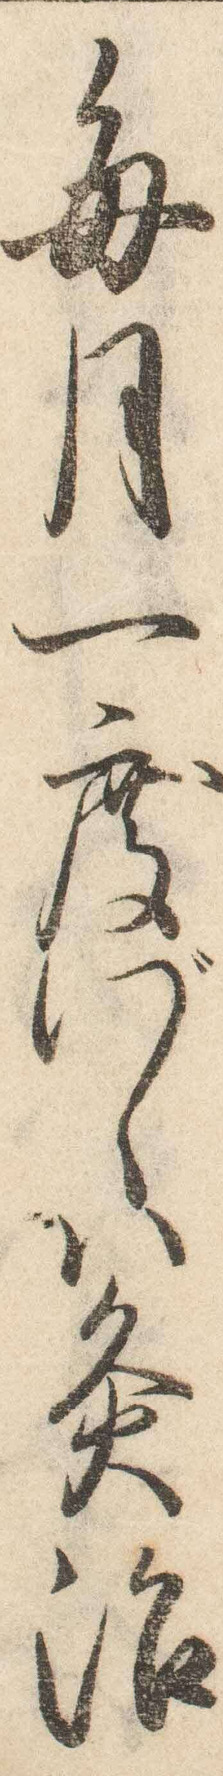毎月一度づゝは灸治
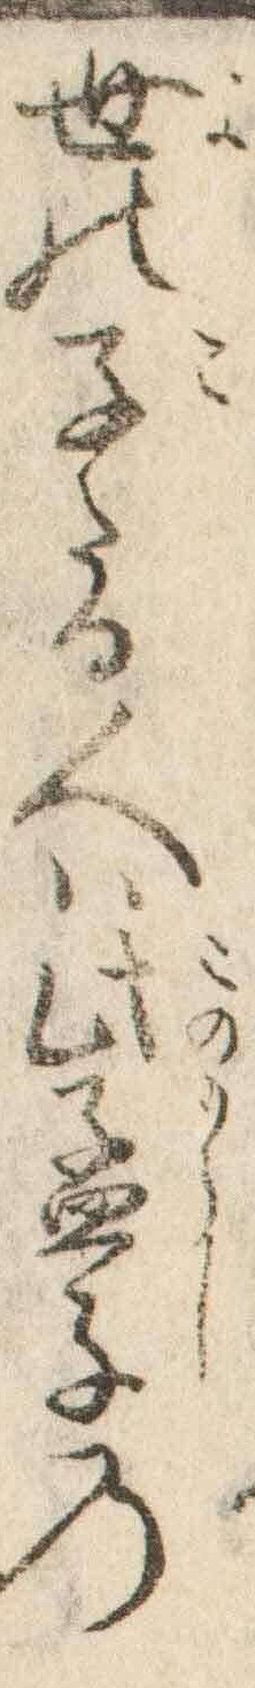世の子たる人は此孟子の
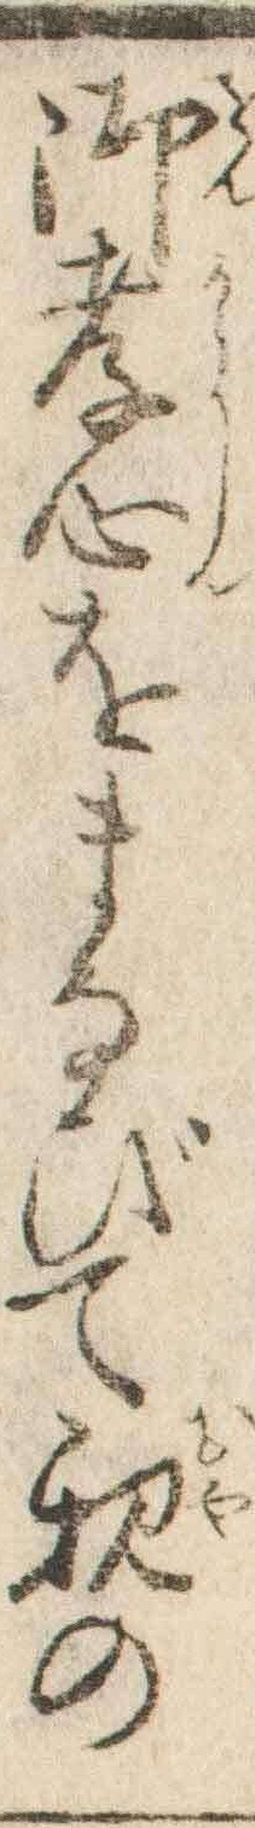御孝心をまなびて親の
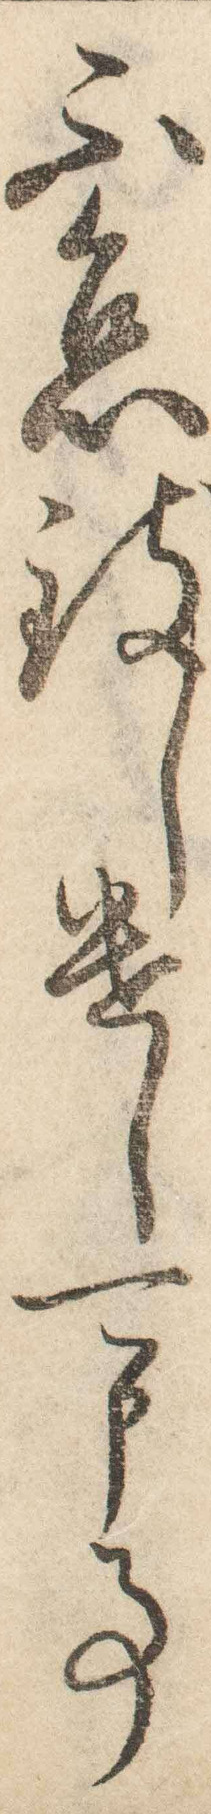不怠致し遣し可申事
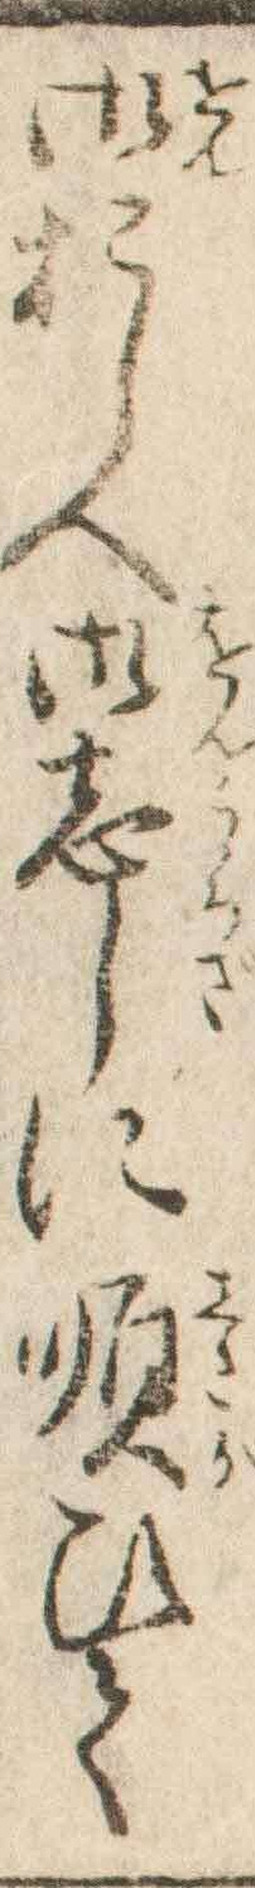御おしへ御志しに順ひて
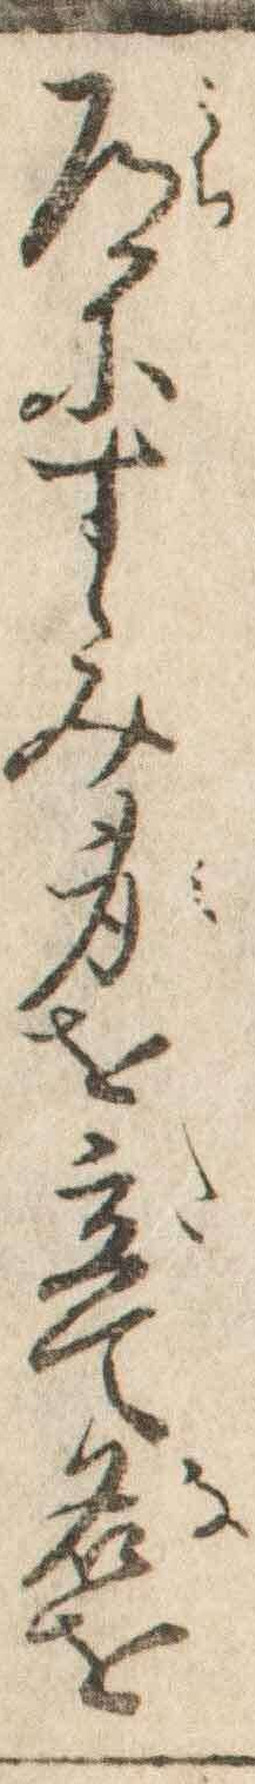道にすゝみ身を立て名を
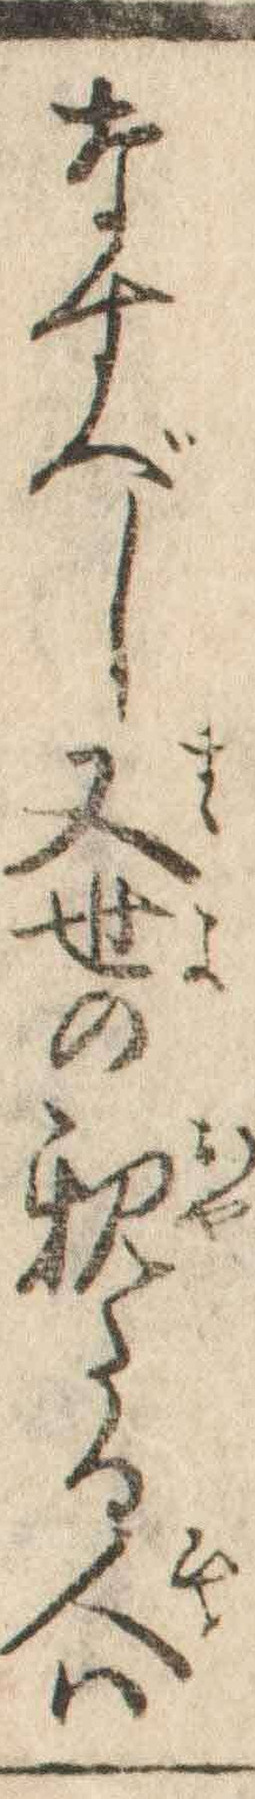なすべし又世の親たる人は
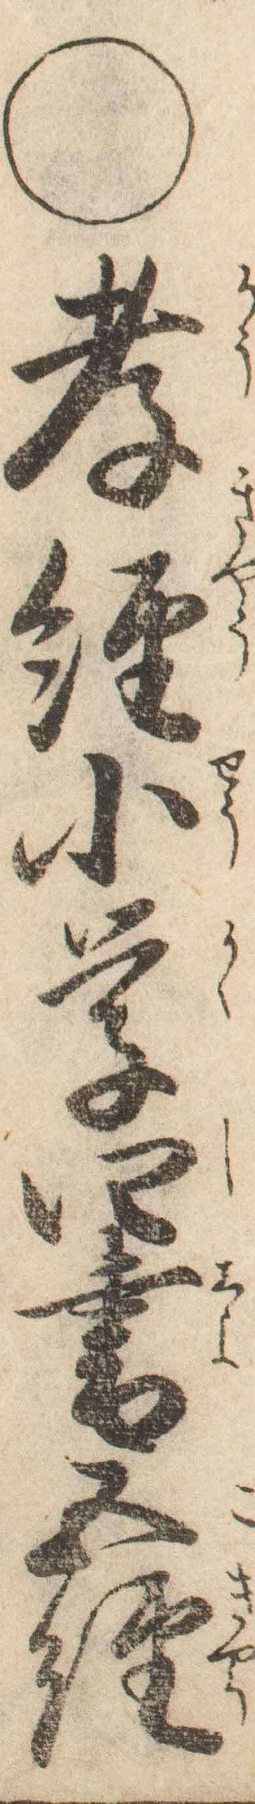〇孝経小学四書五経

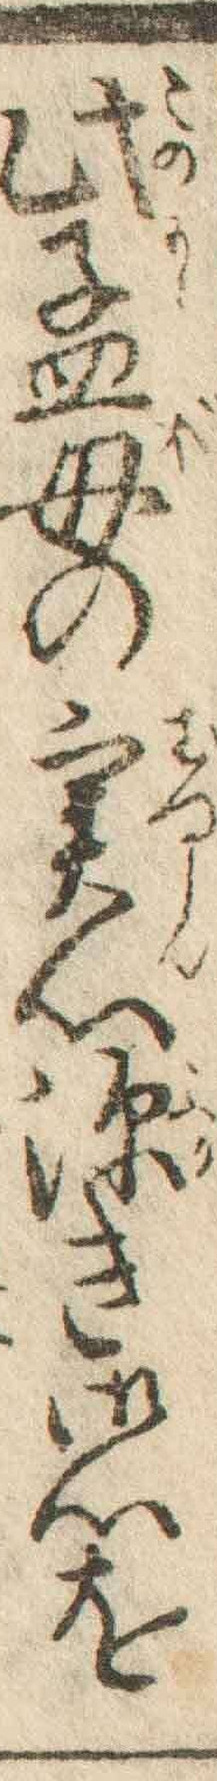此孟母の実心深き御心を
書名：撫育草
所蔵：東京学芸大学附属図書館 国文学研究資料館
